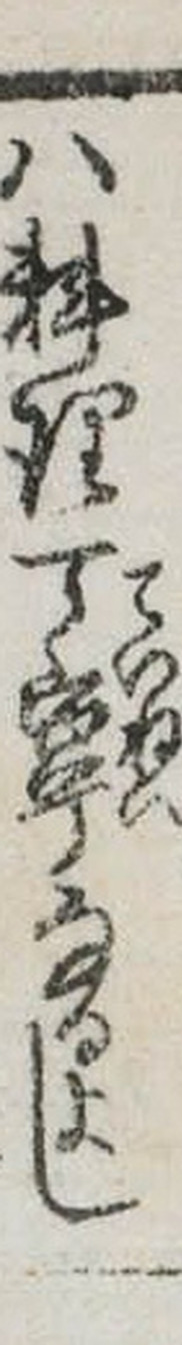は料理丁寧なるよし
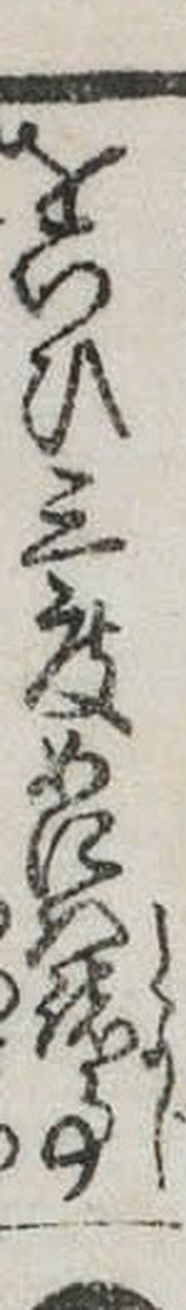をいひ三度めには諸事
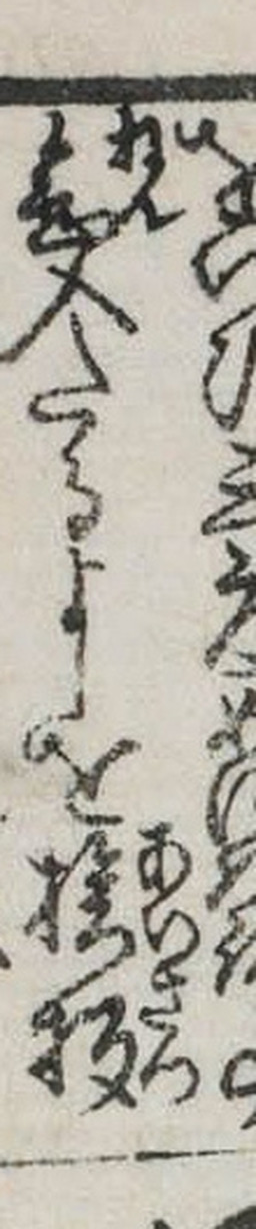念入たるよしを挨拶
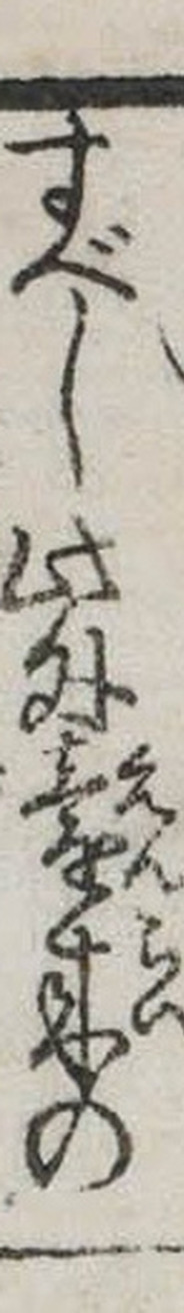すべし此外遠来の
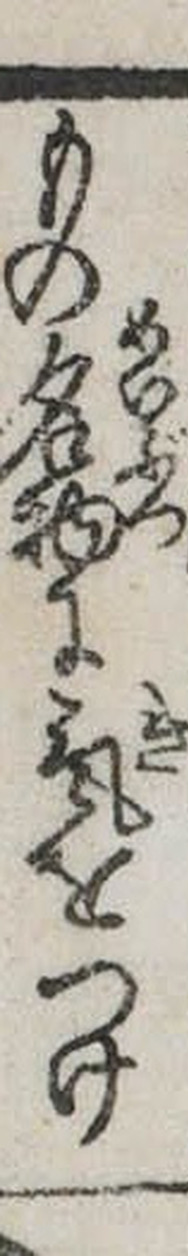もの名物に気をつけ
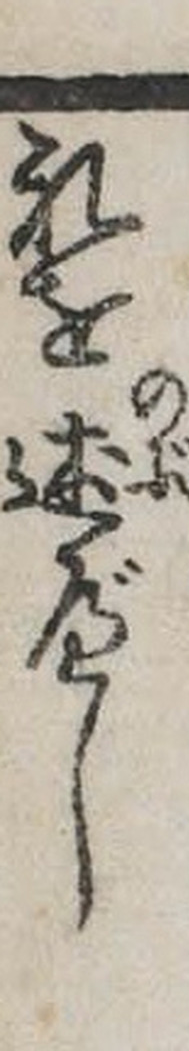礼を述べし

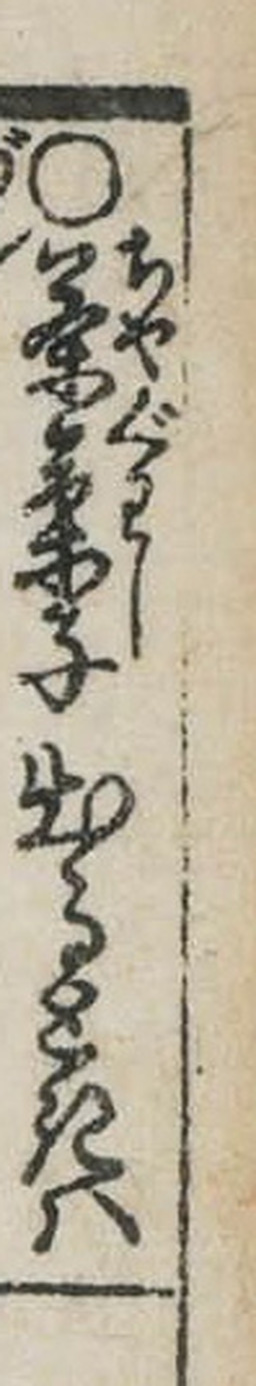○茶菓子出るときは
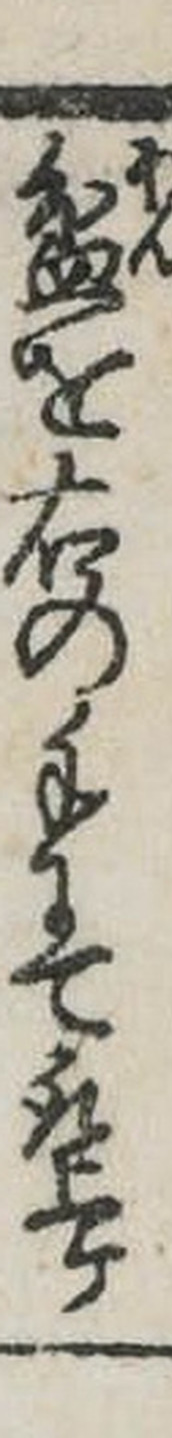盆を右の手にて取上け
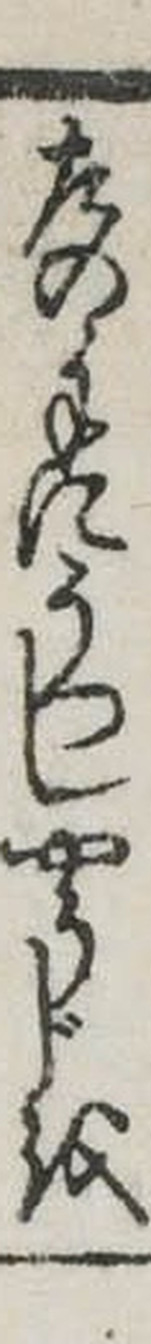左の手にうつしやうじを
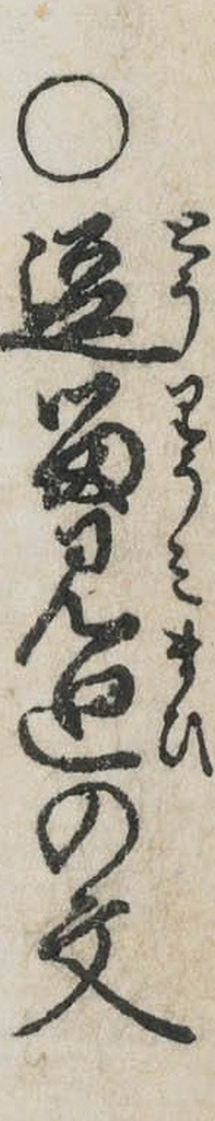○逗留見廻の文
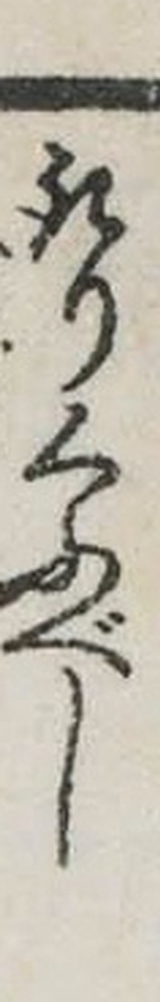取りくふべし
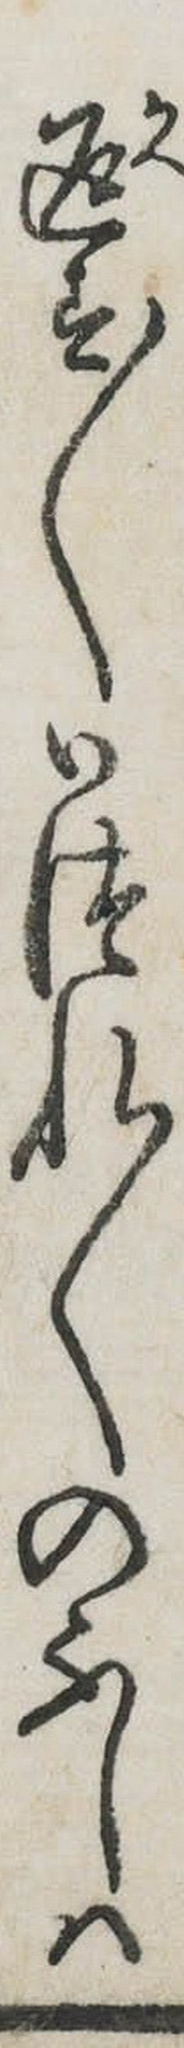返す〳〵御つれ〳〵のふしは
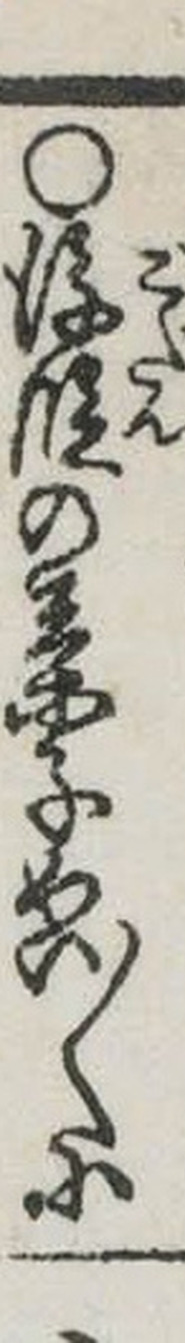○後段の菓子めい〳〵に
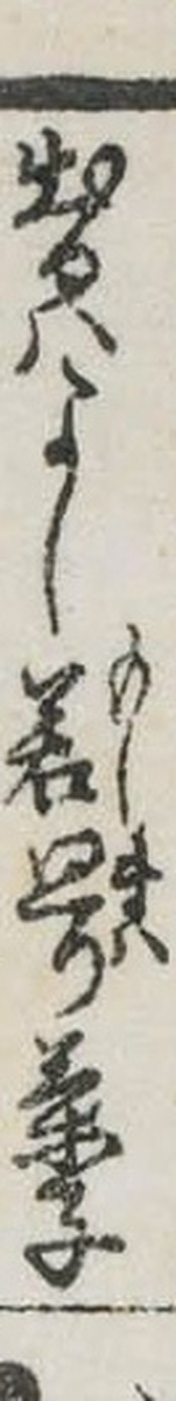出るはよし若廻り菓子
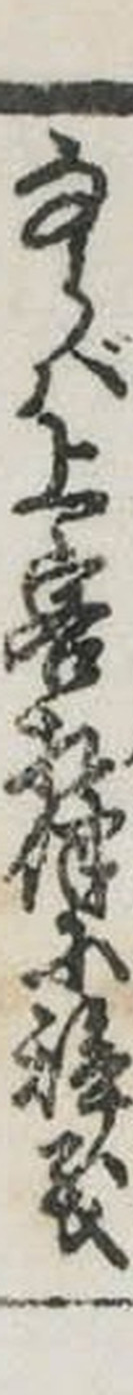ならば上客相伴に辞義
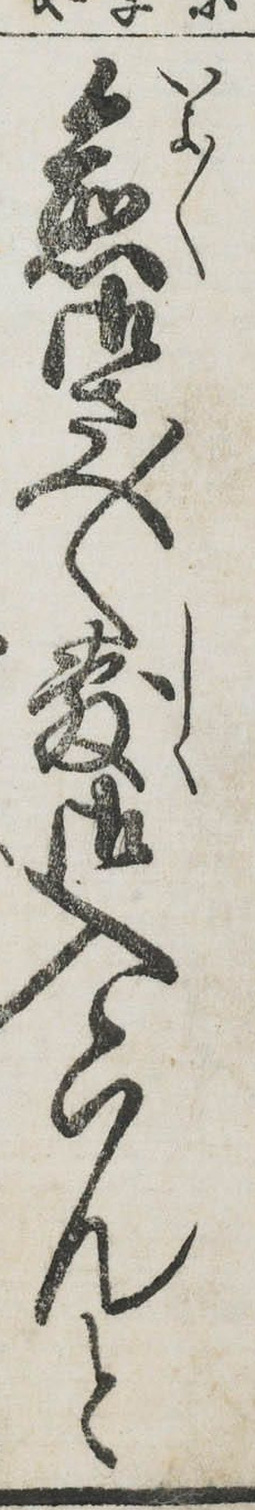愈々御さへ〳〵敷御入候はんと
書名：頭書萬用婦人手紙之文言
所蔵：東京学芸大学教育コンテンツアーカイブ
